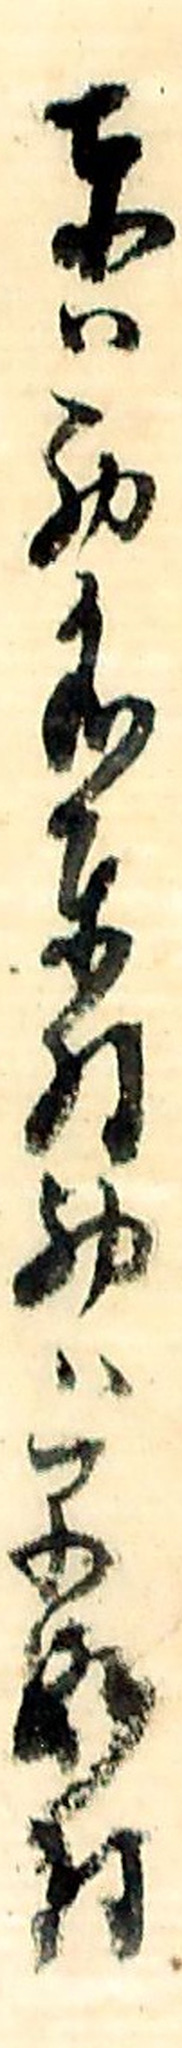東は西名東村西は早淵村
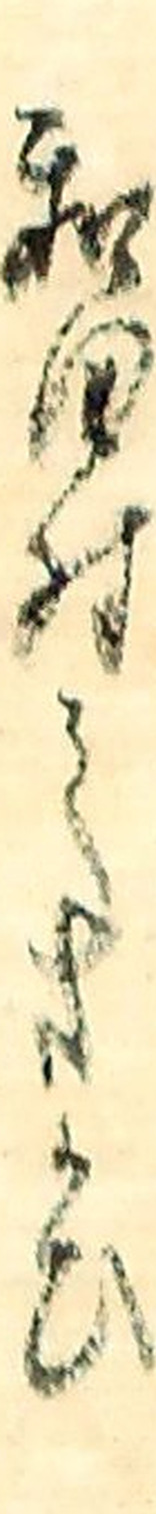和田村之さかひ
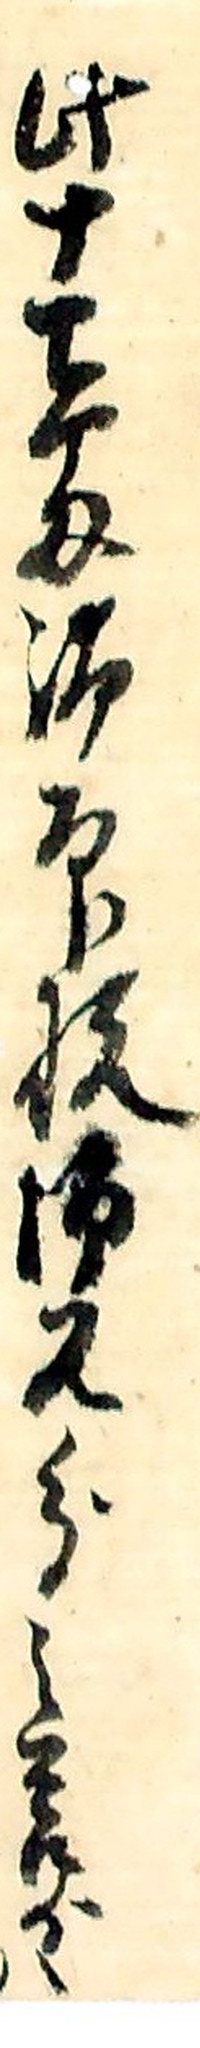此十七両御印杭御見分之節ゟは
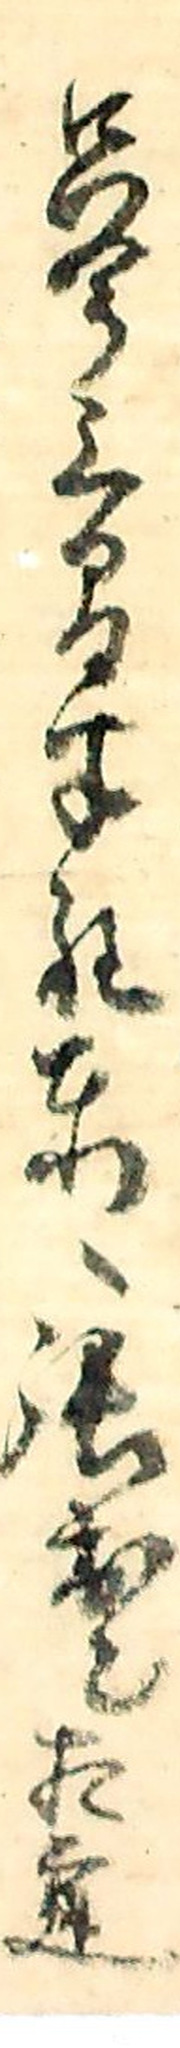只今三間半程東へ張出し相建
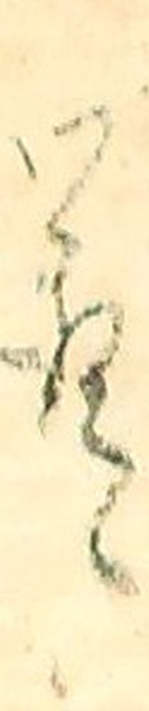御座候
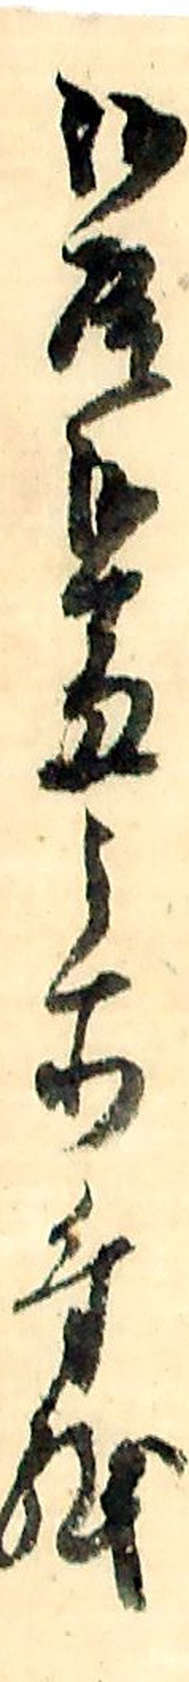弐拾弐番之所付紙
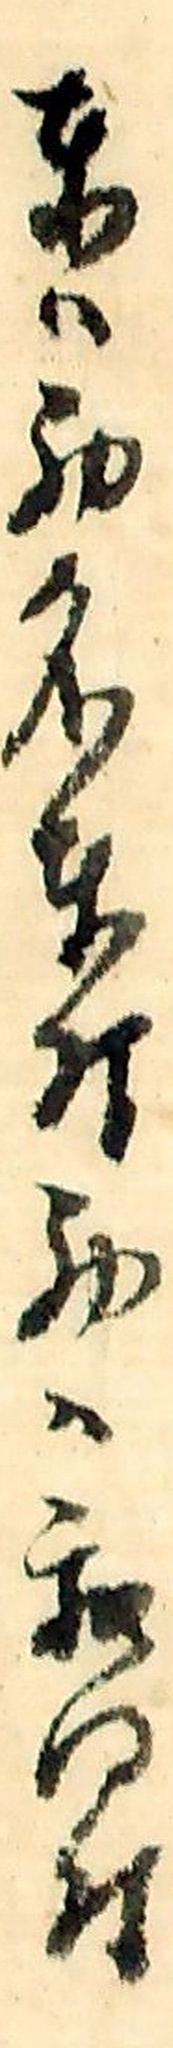東は西名東村西は和田村
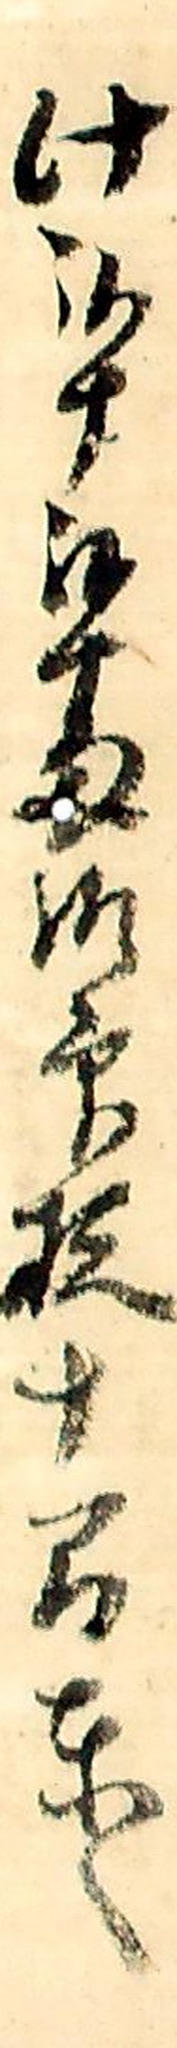此弐十弐番御印杭十間東へ
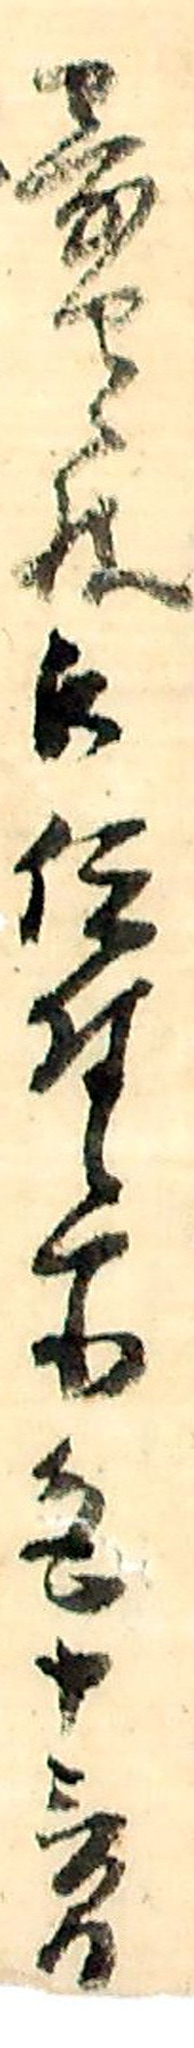寄せ候様被仰付候所色十三間
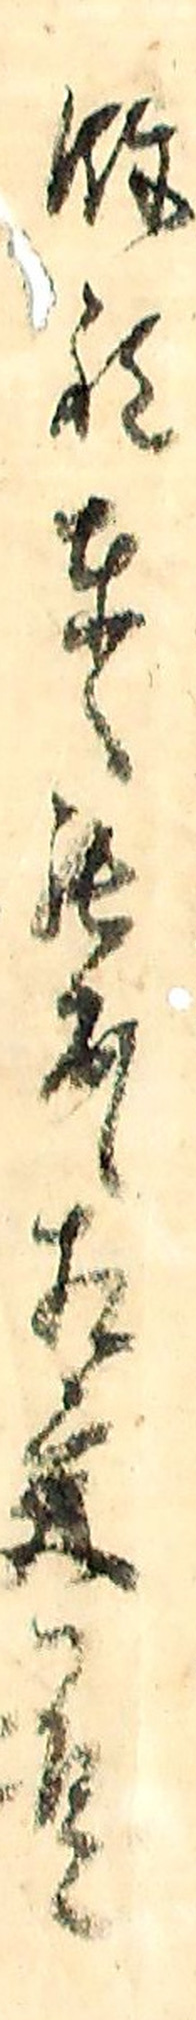余程東へ張出し相建御座候

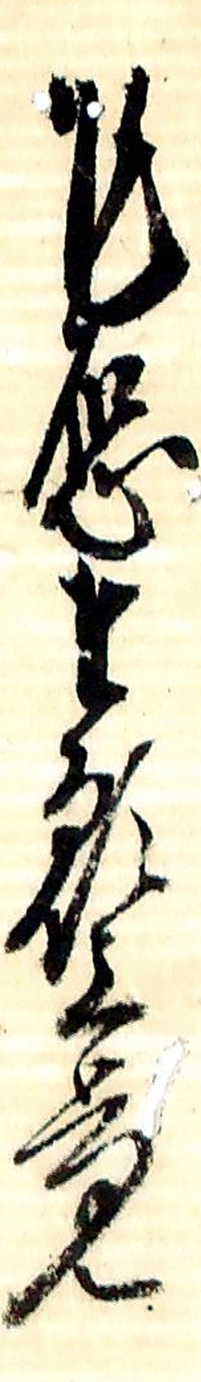乍恐奉願上覚
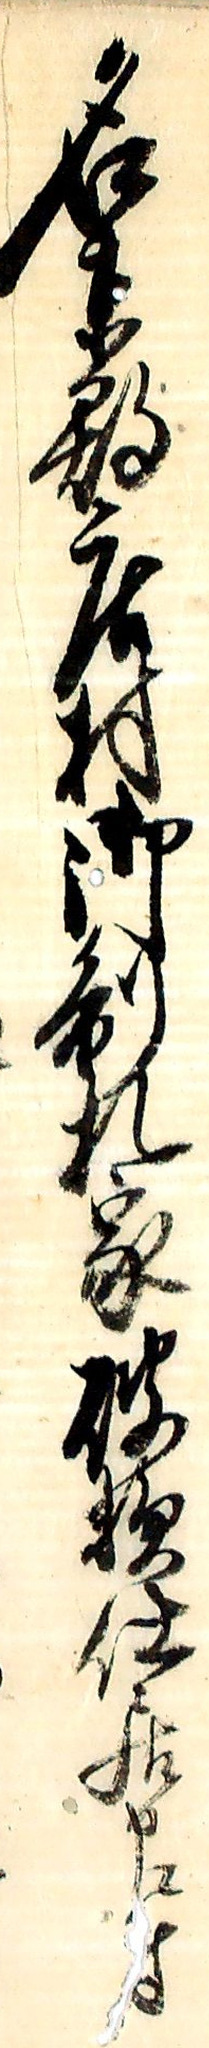名東郡庄村御制札家破損仕居申に付
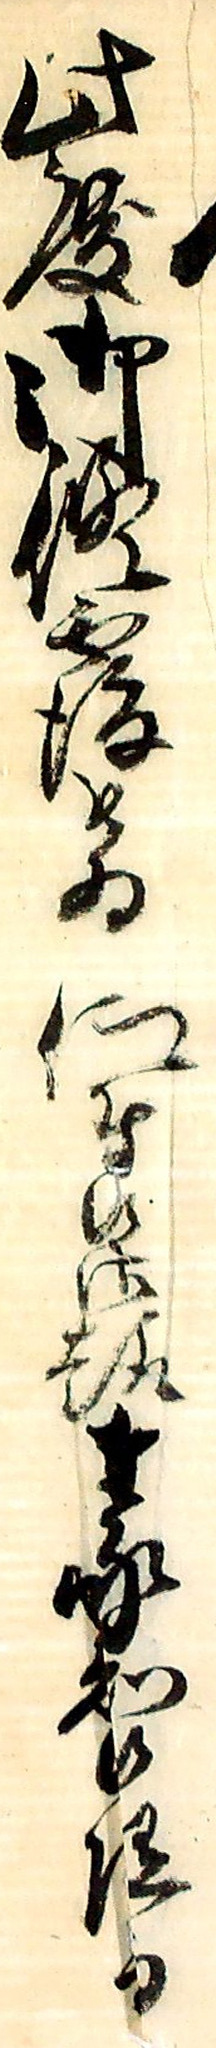此度御修覆被為仰付候御趣奉承知候随て
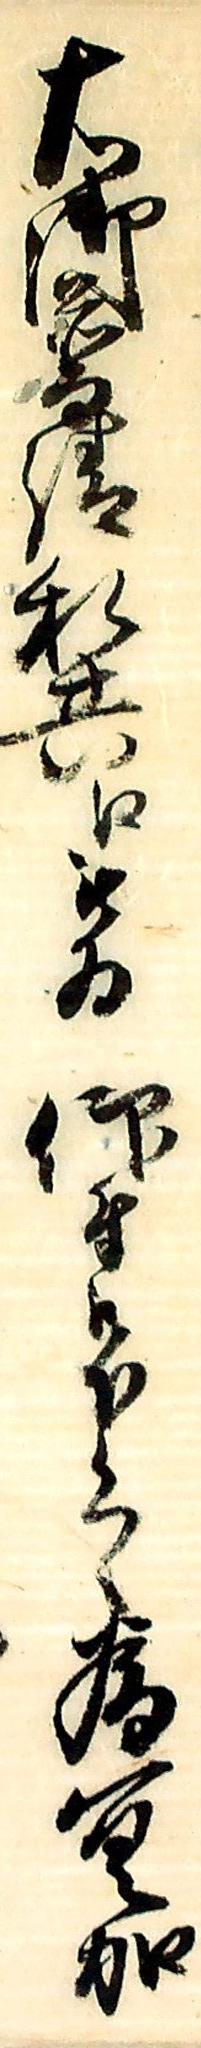右御普請私共え被為仰付被下候はゝ為冥加
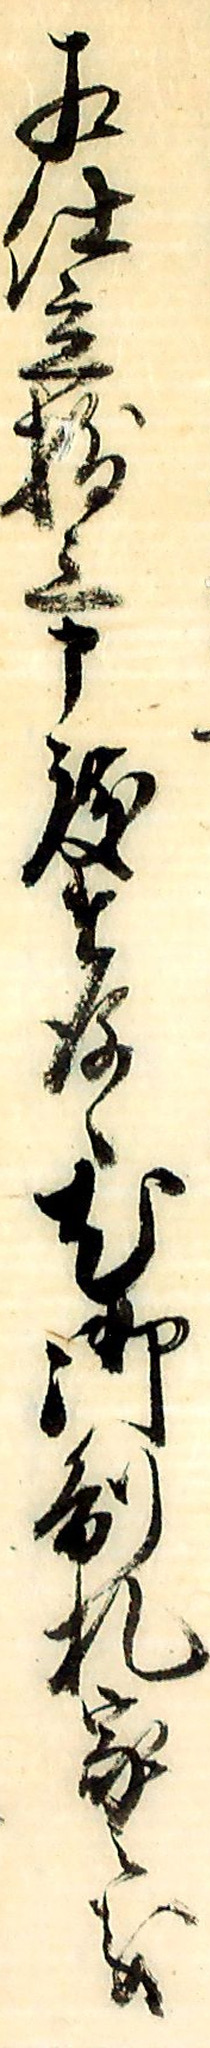相仕立指上申度奉存候尤御制札家之義
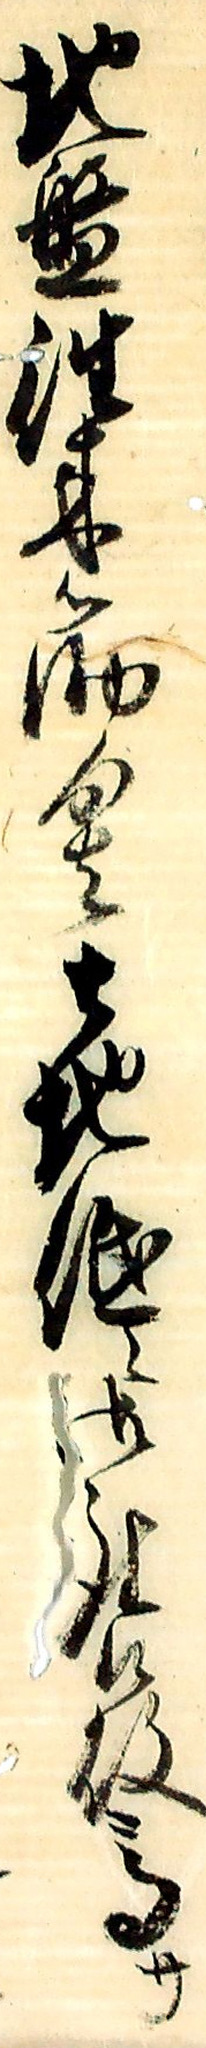地盤往来筋ゟは土地低に御座候故高さ
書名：諸御願書控(後藤氏壱番）
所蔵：鳴門教育大学 Naruto University of Education
